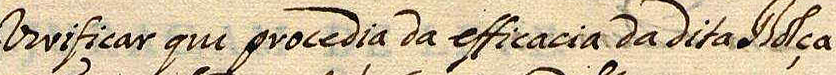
Verificar que procedia da efficacia da dita Bolça
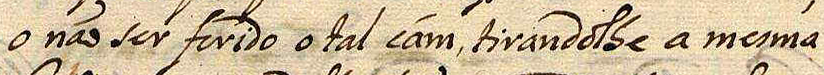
o não ser ferido o tal cám, tirandolhe a mesma
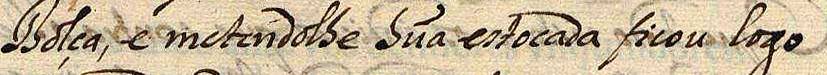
Bolça, e metendolhe hūa estocada ficou logo
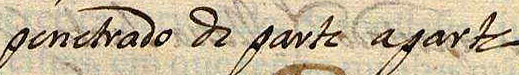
penetrado de parte a parte.
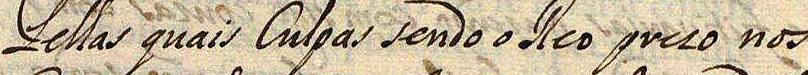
Pellas quais Culpas sendo o Reo preso nos
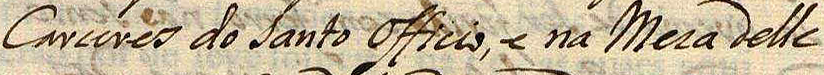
Carceres do Santo Officio, e na Mesa delle
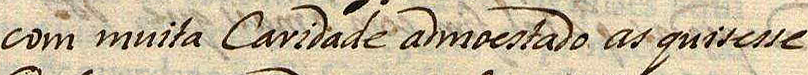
com muita Caridade admoestado as quisesse
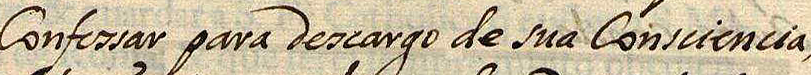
Confessar para descargo de sua Consciencia,
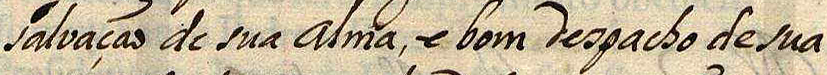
salvação de sua Alma, e bom despacho de sua
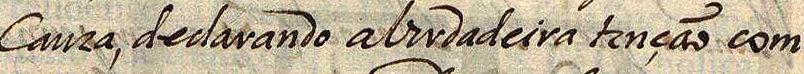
Cauza, declarando a Verdadeira tenção com
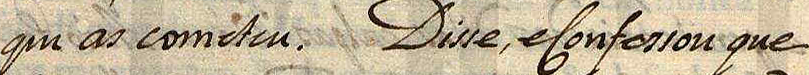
que as cometeu. Disse, e Confessou que
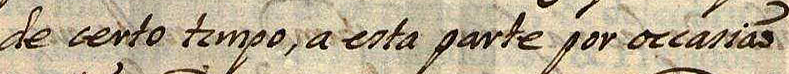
de certo tempo, a esta parte por occasião
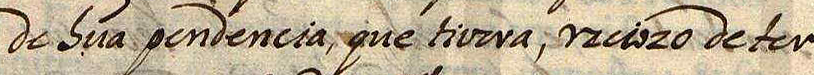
de hūa pendencia, que tivera, reciozo de ter
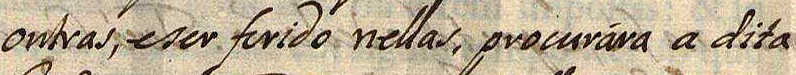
outras, e ser ferido nellas, procurára a dita
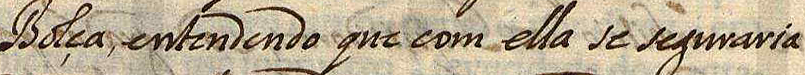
Bolça, entendendo que com ella se seguraria
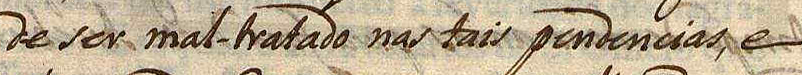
de ser mal-tratado nas tais pendencias, e
